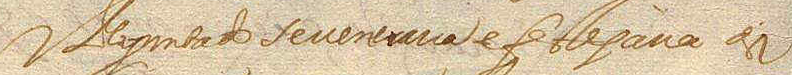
item Perguntado se ueneraua e festejaua as
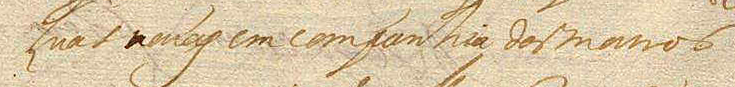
Luas nouas em companhia dos mouros
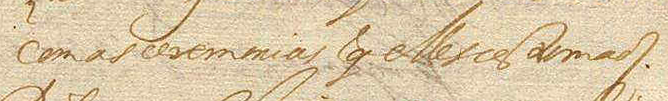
com as ceremonias q̄ elles costumaõ?
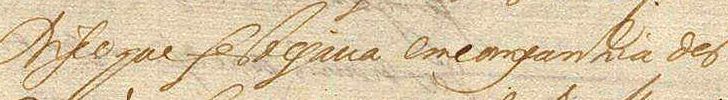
Disse que festejaua em companhia dos
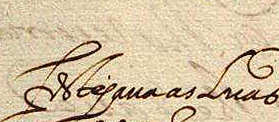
festejaua as Luas
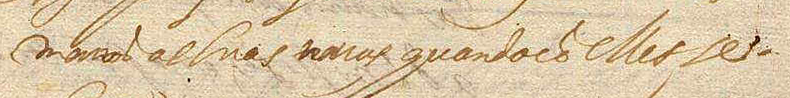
mouros as luas nouas quando cō elles se
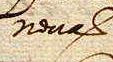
nouas
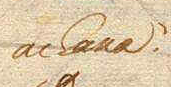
achaua.
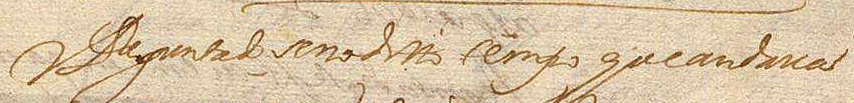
item Preguntado se no ditto tempo que andaua
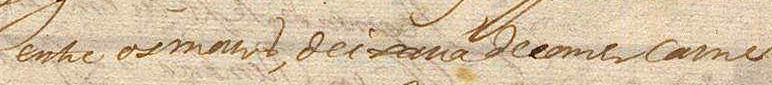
entre os mouros, deixaua de comer carne
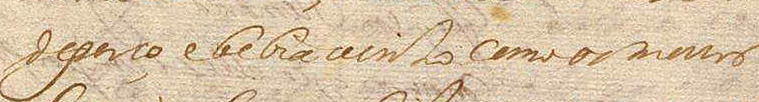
de porco, e bebia uinho como os mouros
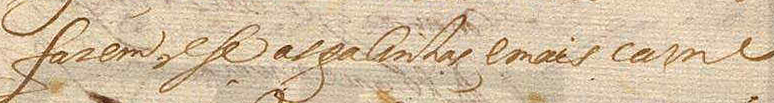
fazem, e se as galinhas e mais carne
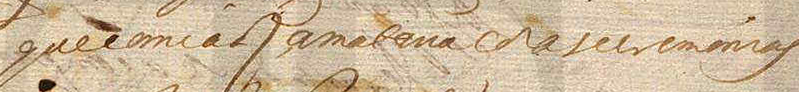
que comiaõ a mataua cō as ceremonias
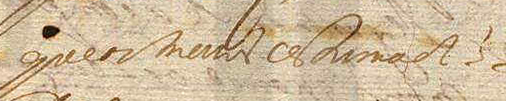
que os mouros costumaõ?
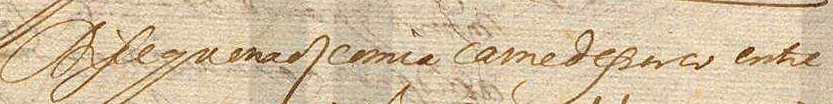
Disse que naõ comia carne de porco entre
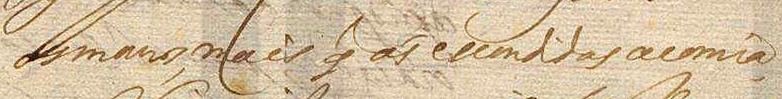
os mouros mais q̄ ás escondidas a comia
